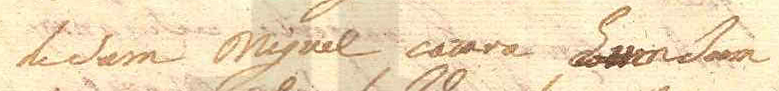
de Sam Miguel cazara hum Ioam
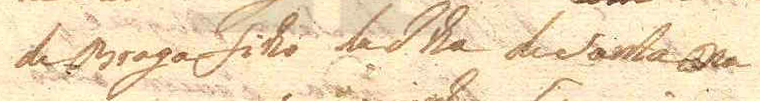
de Braga filho de Ilha de Santa Ma
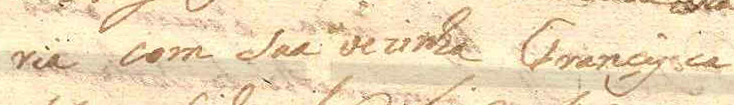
ria com sua vezinha Francisca
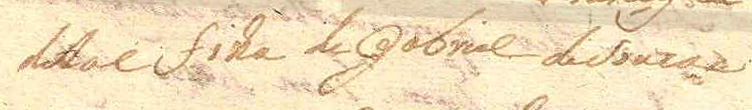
dita e filha de Gabriel de Souza
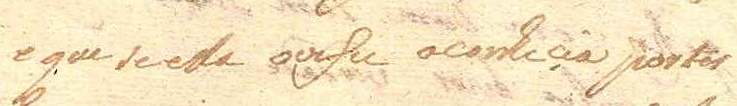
e que se ella o visse o conhecia por ter
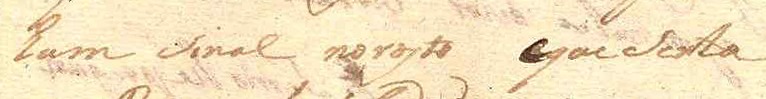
hum sinal no rosto e que senta
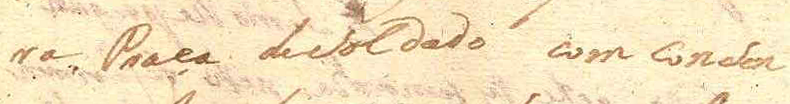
ra, Praça de Soldado com consen
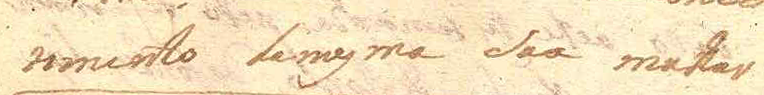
timento da mesma sua mulher
